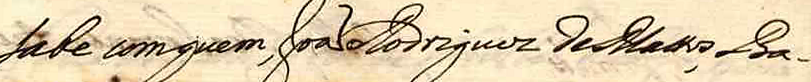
Sabe com quem, João Rodrigues de Mattos, Ba
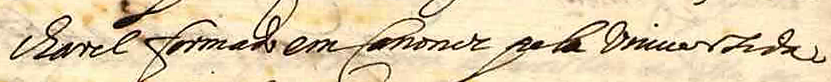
charel formado em Canonez pela Vniuersida
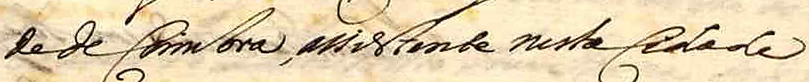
de de Coimbra, assistente nesta Cidade
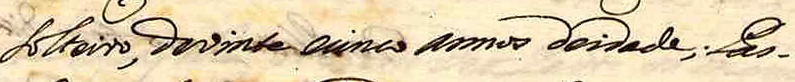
solteiro, de vinte e cinco annos de idade, Pas
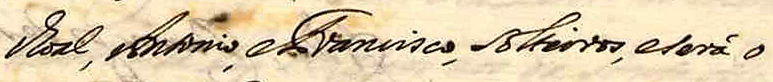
choal, António, e Francisco, solteiros, e será o
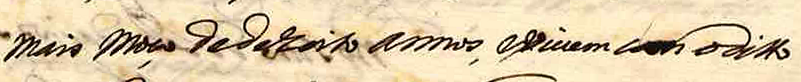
mais moço de dezoito annos, e vivem com o ditto
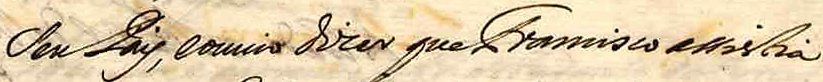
Seu Pay, e ouuio dizer que Francisco assistia
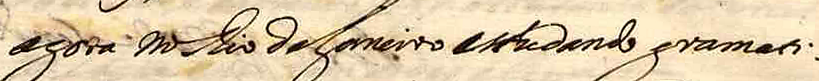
agora no Rio de Janeiro estudando gramati
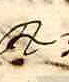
A 3
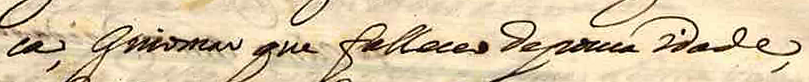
ca, Guiomar que falleceo de pouca idade,
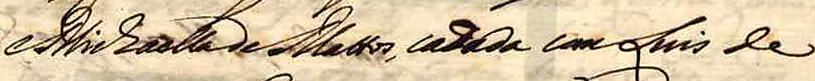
e Michaella de Mattos, cazada com Luis de
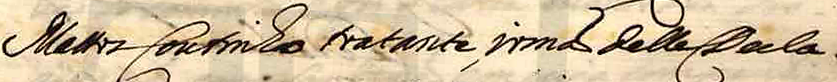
Mattos Coutinho, tratante, irmão delle Decla
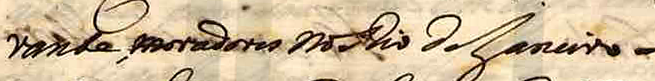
rante, moradores no Rio de Janeiro.
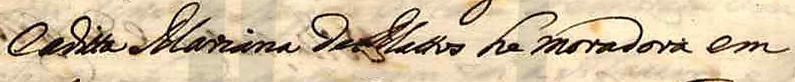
e a ditta Mariana de Mattos he moradora em
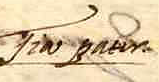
Tia pater.
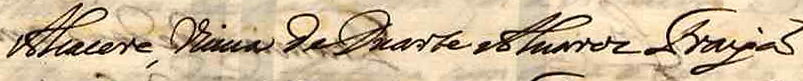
Alcacere, Viuua de Duarte Alvarez Frayaõ
